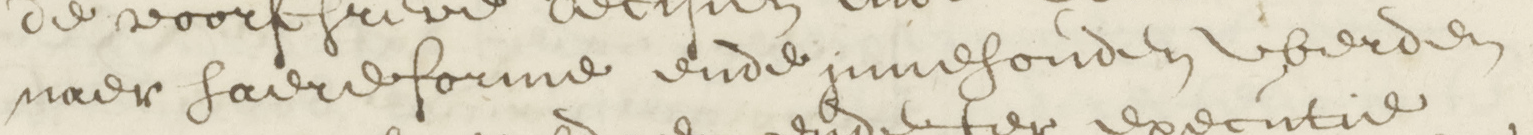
naer haere forme ende innehouden werden
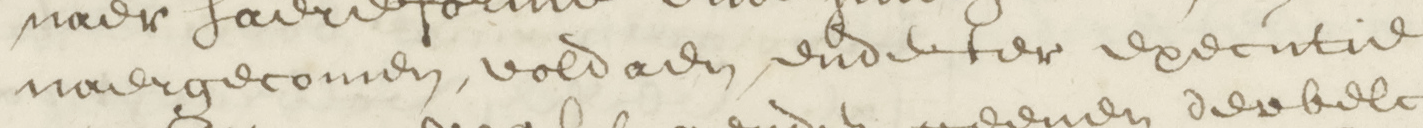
naergecomen, voldaen, ende ter executie
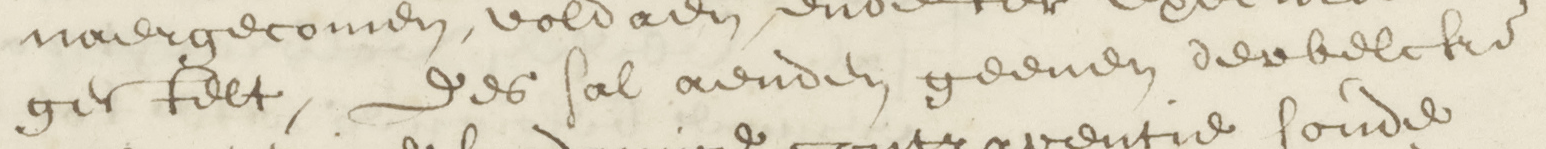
gestelt, Des sal aenden geenen derwelcke
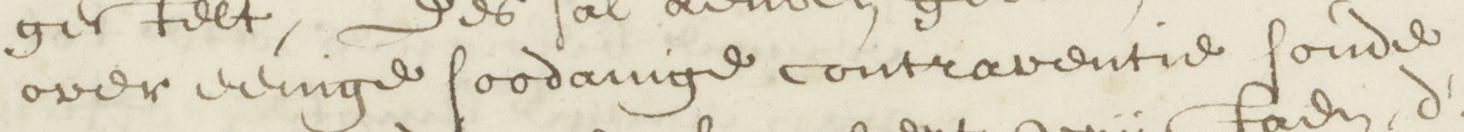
over eenige soodanige contraventie soude
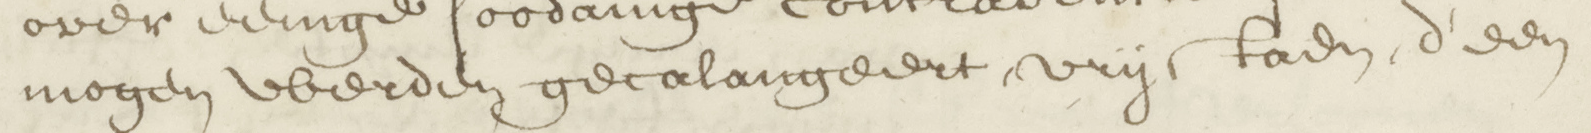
mogen werden gecalangeert, vrijstaen, d‛een
